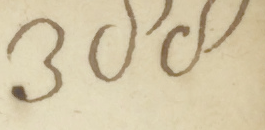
388
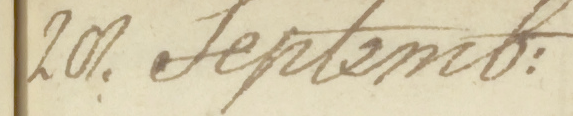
28. Septemb:
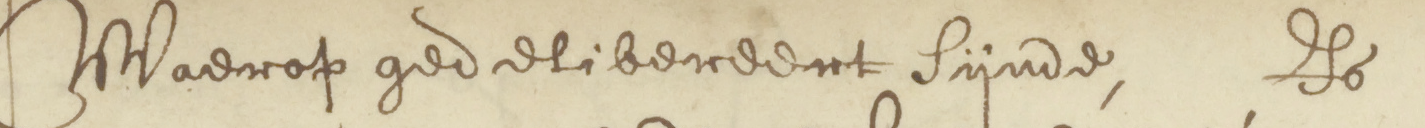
Waerop gedelibereert sijnde, Is
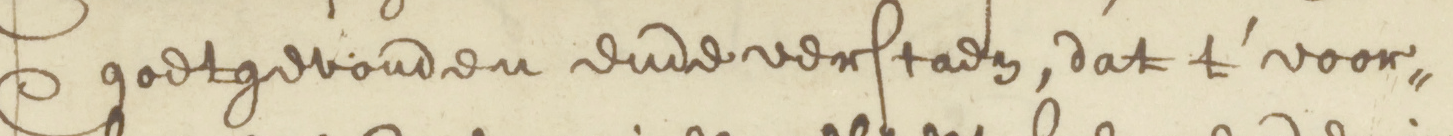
goetgevonden ende verstaen, dat t' voor„
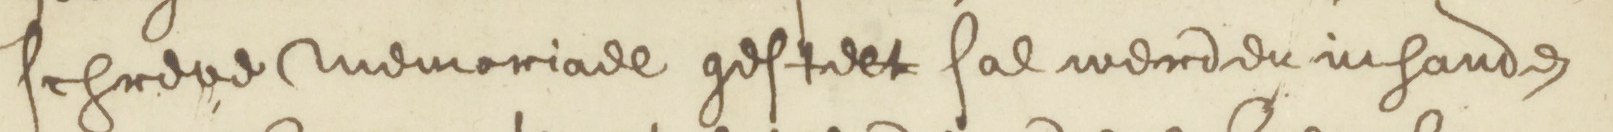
schreve memoriael gestelt sal werden in handen
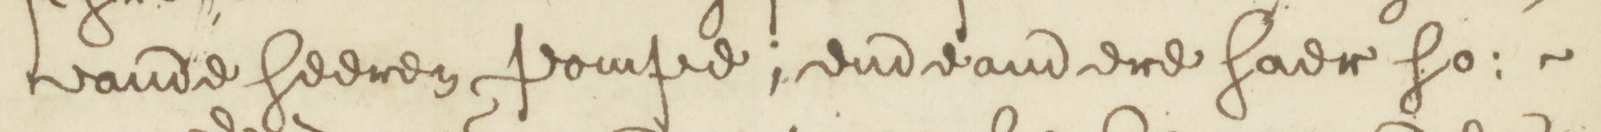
vande heeren Pompe, ende andere haer Ho:
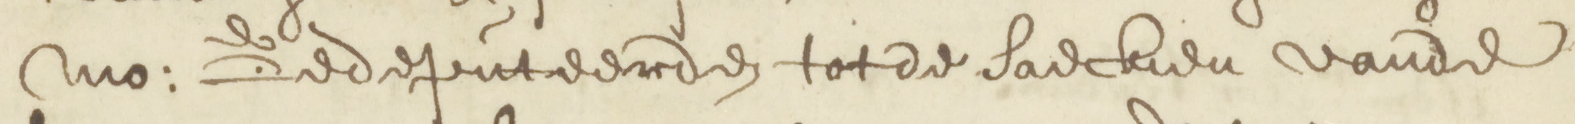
Mo: Gedeputeerden tot de saecken vande
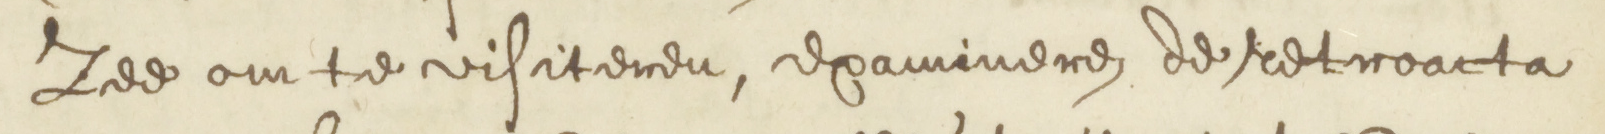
Zee om te visiteren, examineren de retroacta
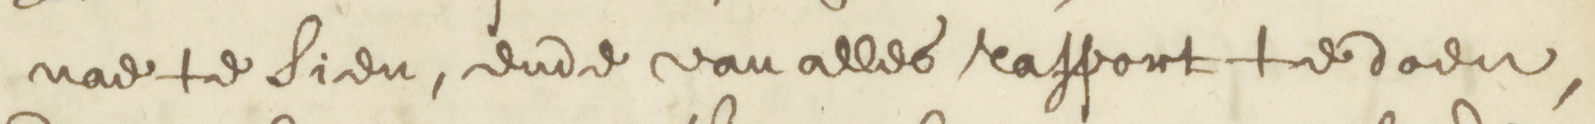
nae te sien, ende van alles rapport te doen.
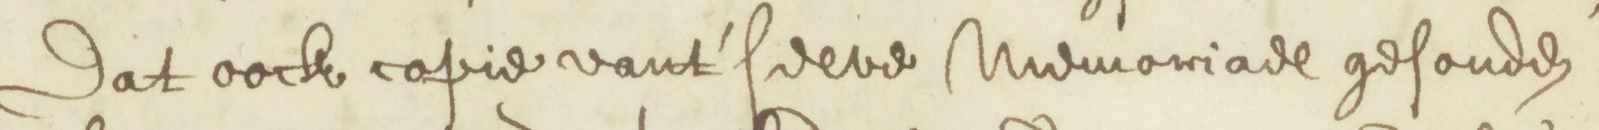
Dat oock copie vant' selve memoriael gesonden
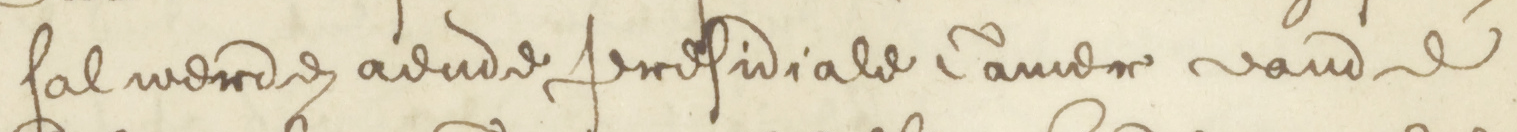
sal werden aende presidiale Camer vande
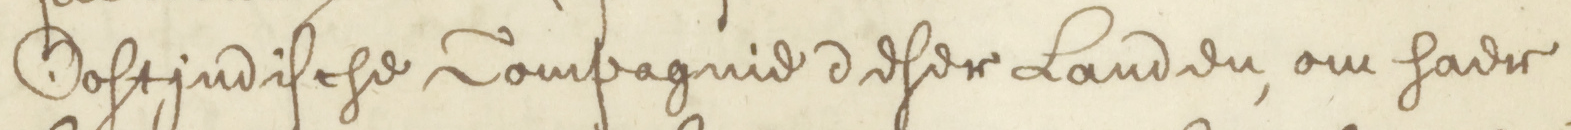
Oostindische Compagnie deser Landen, om haer
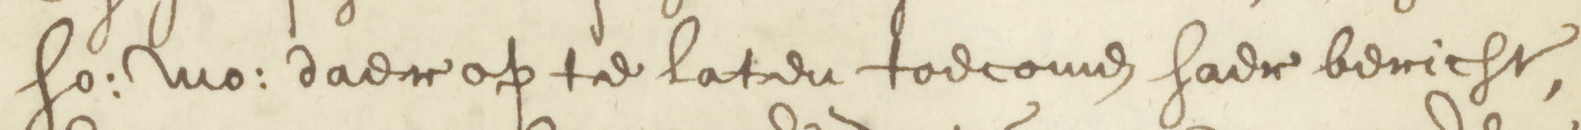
Ho:Mo: daer op te laten toecomen haer bericht,
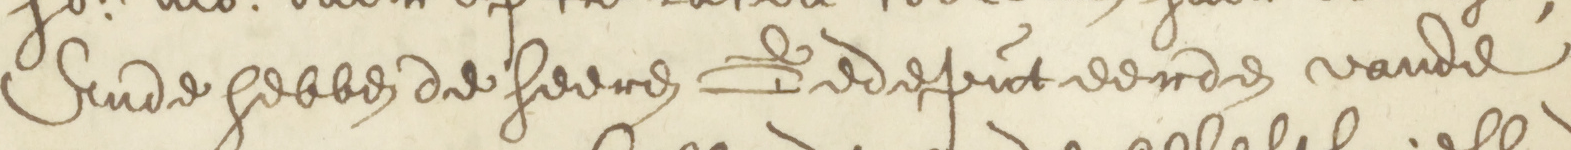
Ende hebben de heeren Gedeputeerden vande
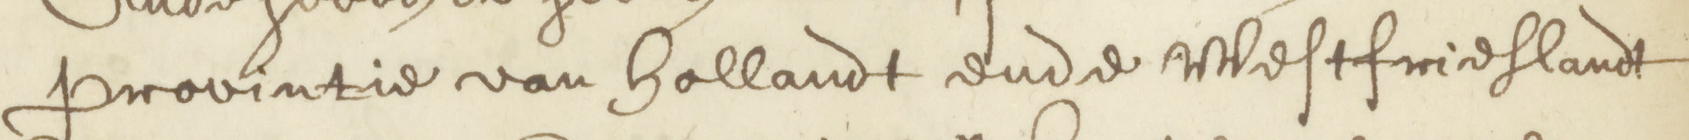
Provintie van Hollandt ende Westfrieslandt
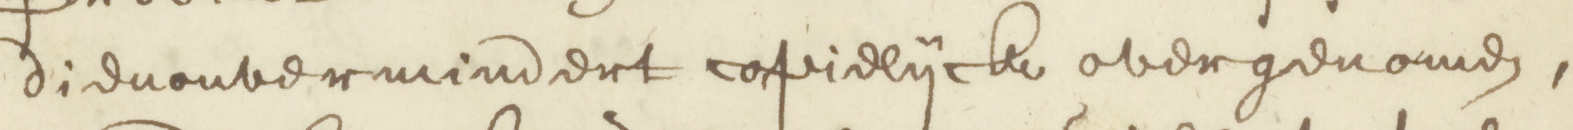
dienonvermindert copielijck overgenomen,
